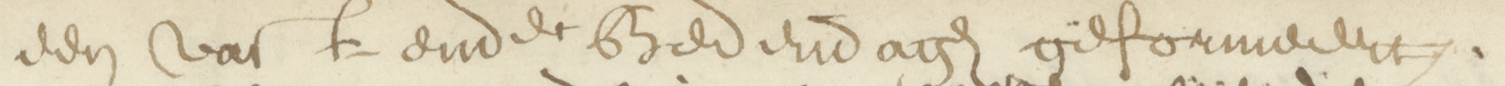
een vast ende Bedendagh geformeert,
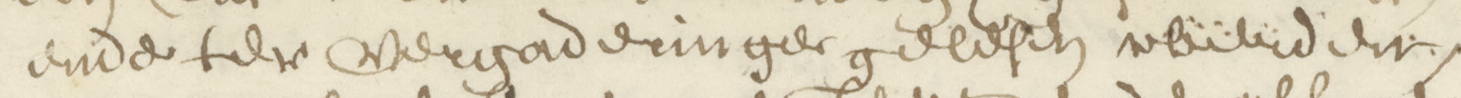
ende ter Vergaderinge gelesen werden,
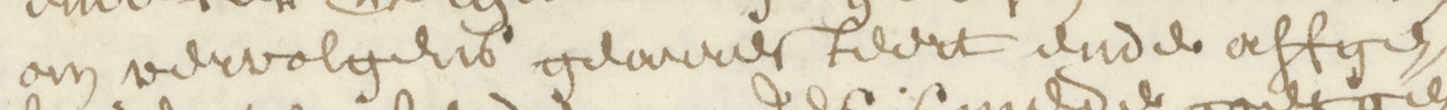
om vervolgens gearresteert ende affge„
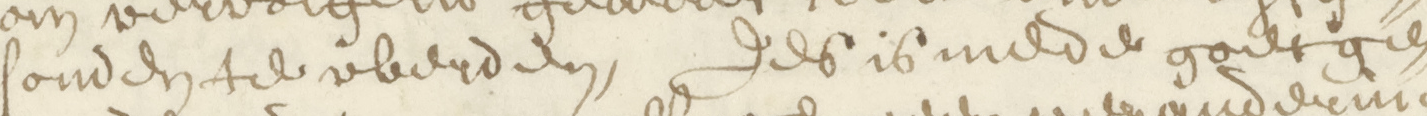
sonden te werden. Des is mede goetge„
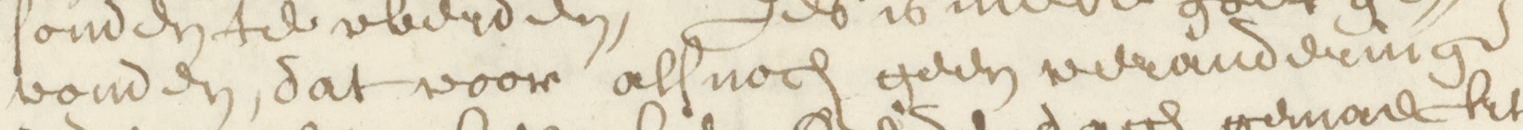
vonden, dat voor alsnoch geen veranderinge
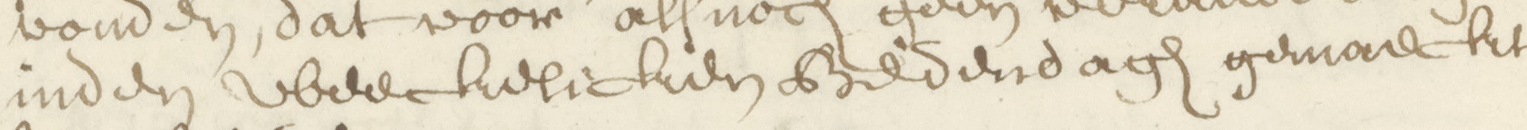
inden weeckelicken Bedendagh gemaeckt
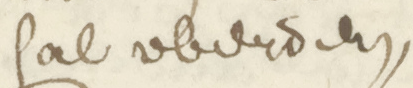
sal werden.
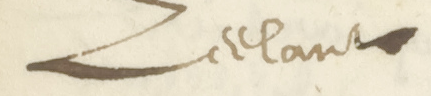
Zeelant
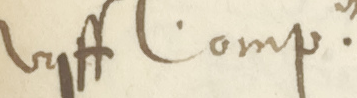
vyff Compen.
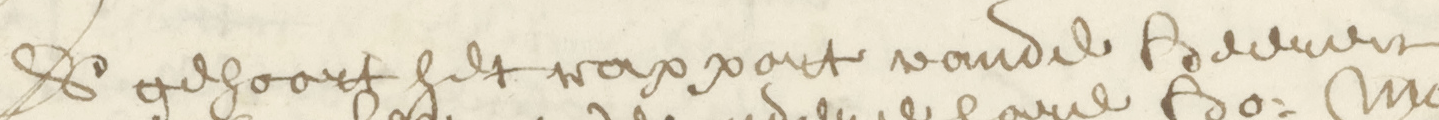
Is gehoort het rapport vande Heeren
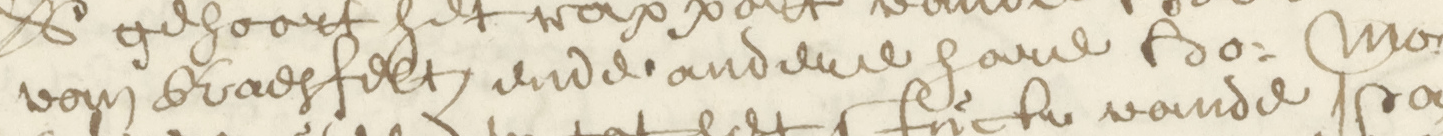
van Raesfelt, ende andere hare Ho:Mo:
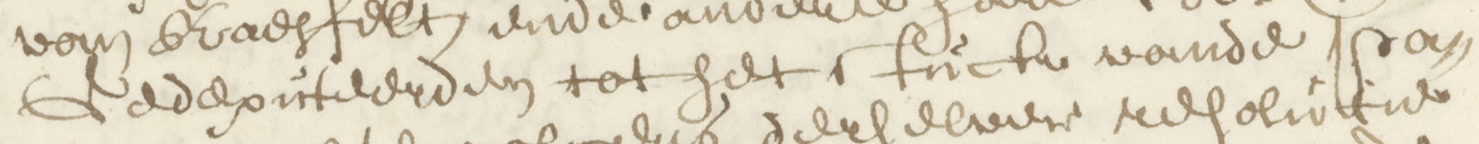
Gedeputeerden tot het stuck vande Pa„
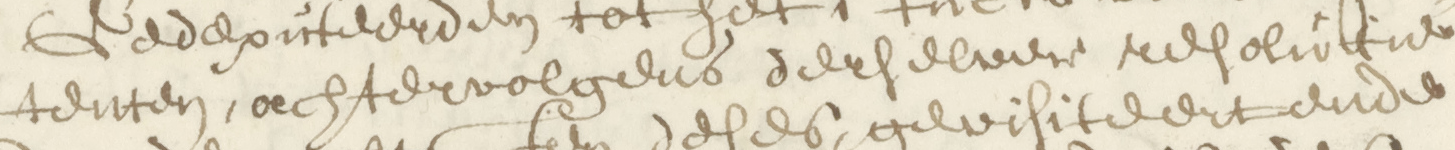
tenten, achtervolgens derselver resolutie
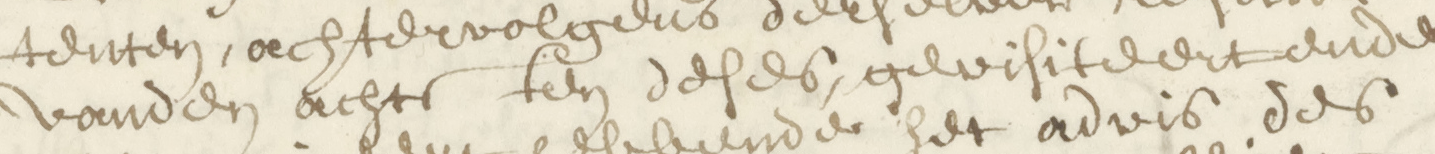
vanden achtsten deses, gevisiteert ende
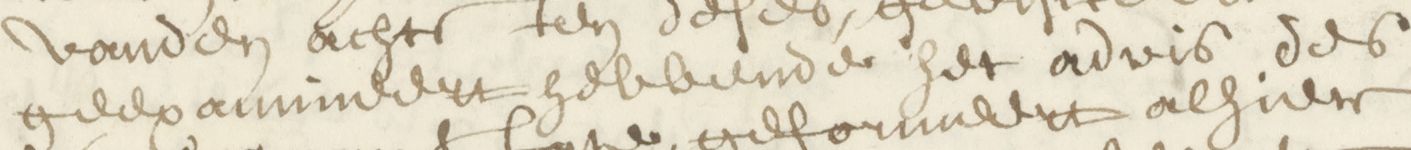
geexamineert hebbende het advis des
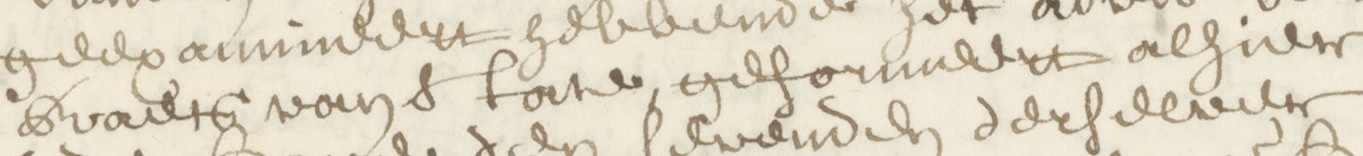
Raets van State, geformeert alhier
